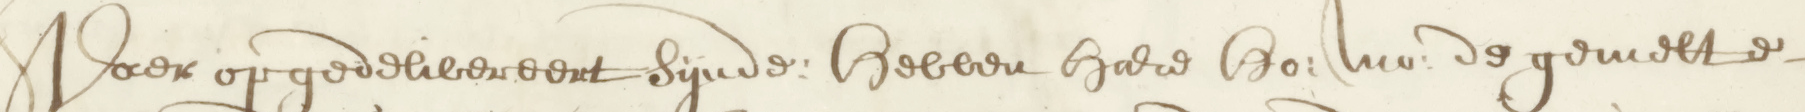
Waer op gedelibereert sijnde: hebben hare Ho:Mo: de gemelte —
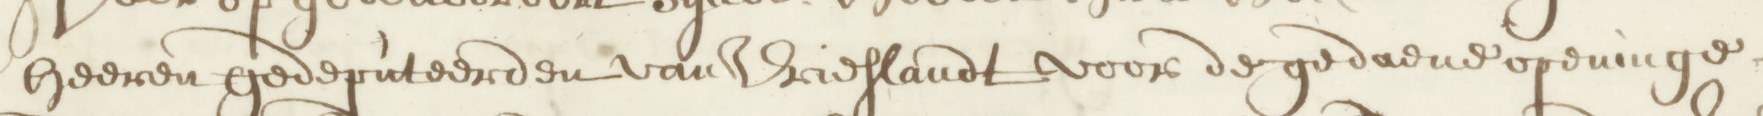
Heeren gedeputeerden van Vrieslandt voor de gedaene openinge —
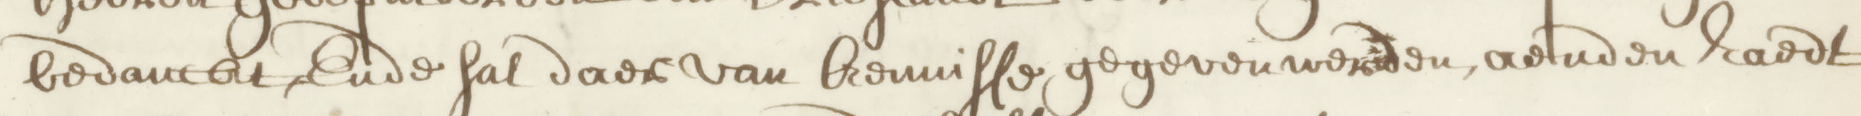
bedanckt, Ende sal daer van kennisse, gegeven werden, aenden Raedt
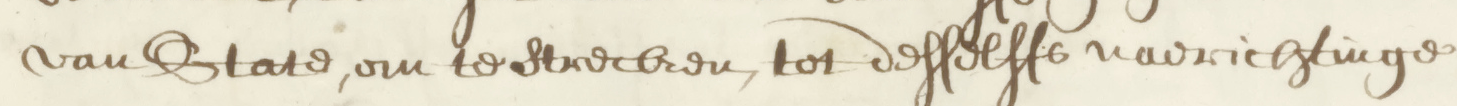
van State, om te strecken, tot desselffs naerichtinge. —
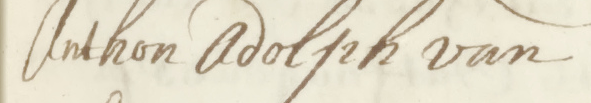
Anthon Adolph van
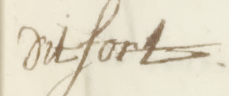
ditfort.
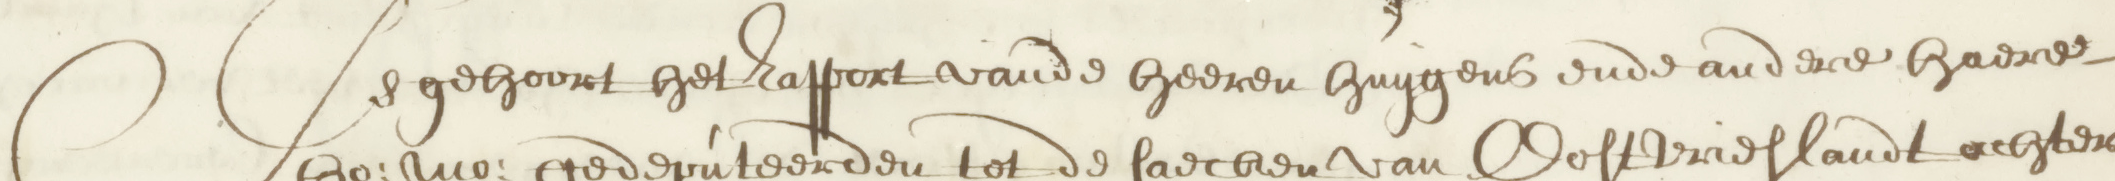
Is gehoort het rapport vande heeren Huijgens ende andere haere
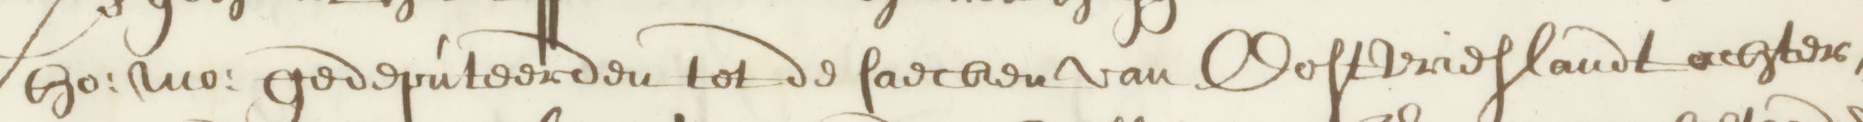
Ho:Mo: gedeputeerden tot de saecken van Oostvrieslandt achter,,
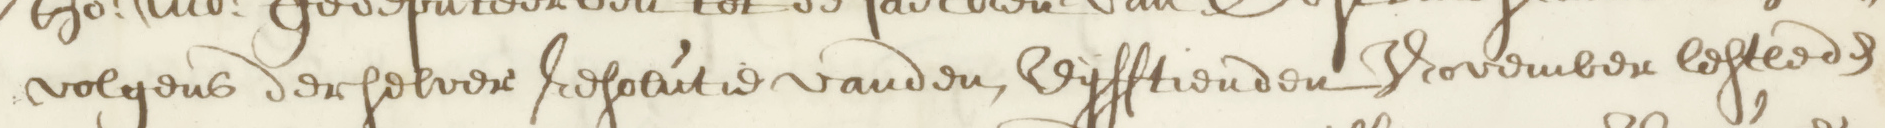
volgens derselver resolutie vanden Vijfftienden November lestleden
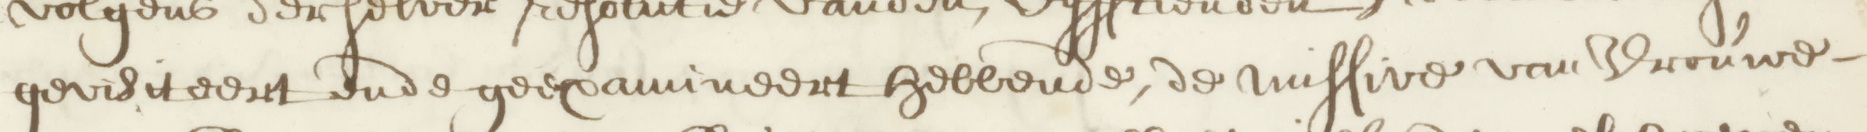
gevisiteert ende geexamineert hebbende, de missive van Vrouwe —
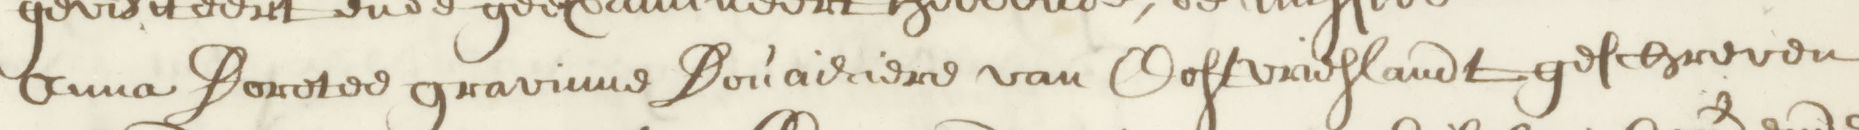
Anna Dorotee gravinne Douairiere van Oostvrieslandt geschreven
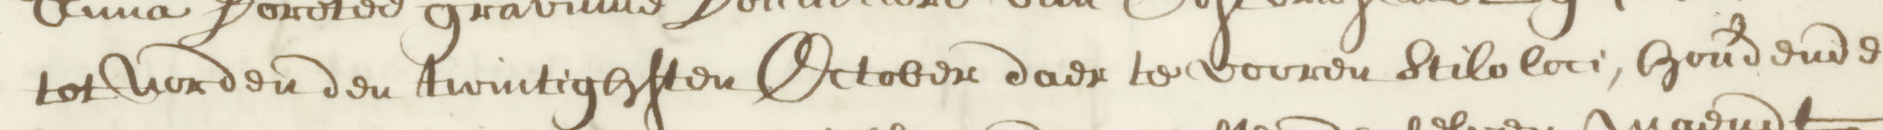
tot Norden den twintighsten October daer te vooren Stilo loci, houdende
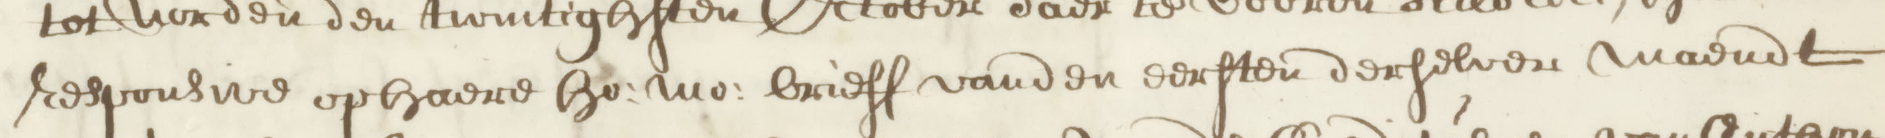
responsive op haere Ho:Mo: brieff vanden eersten derselven maendt
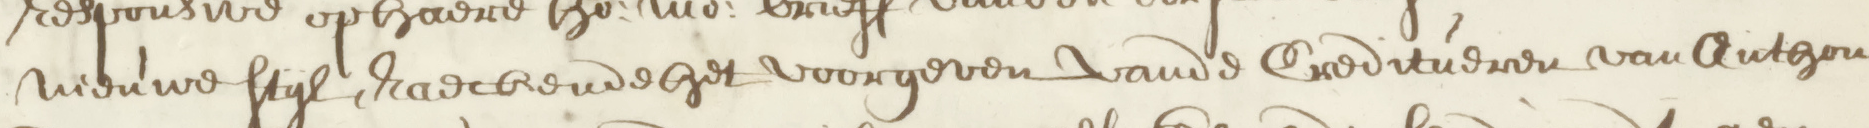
nieuwe stijl, raeckende het voorgeven vande Creditueren van Anthon
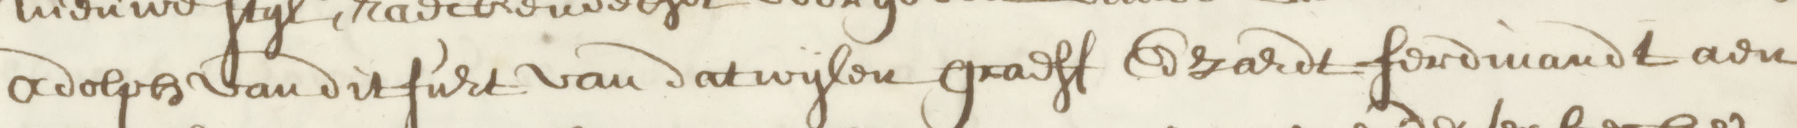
adolph van ditfurt van dat wijlen graeff Edzardt ferdinandt aen
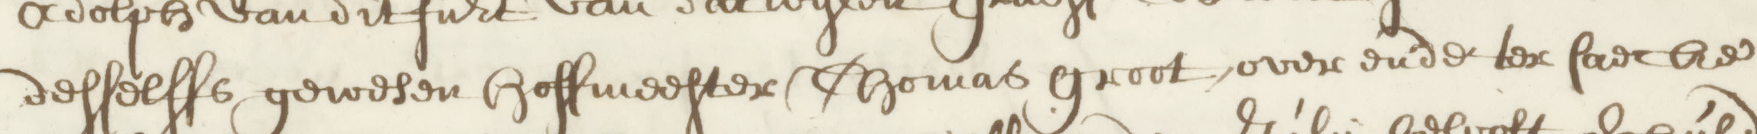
desselffs gewesen Hoffmeester Thomas Groot, over ende ter saecke —
